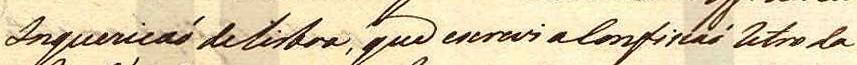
Inqueziçaõ de Lisboa, que escrevi a Confissaõ Retro da
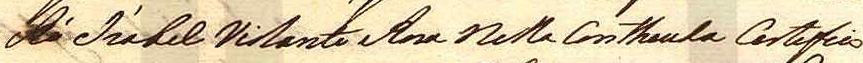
Ré Izabel Viotante Roza nella Contheuda Certifico
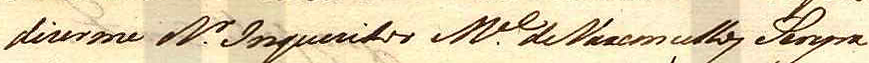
dizerme o S.r Inquizidor M.el de Vasconcellos Pereyra
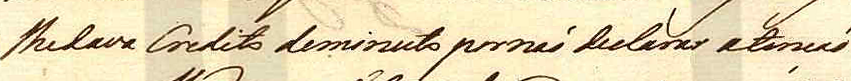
lhe dava Credito deminuto por naõ declarar a tençaõ
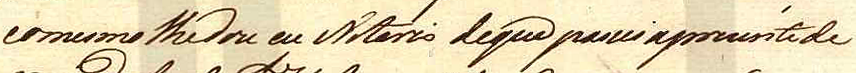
e o mesmo lhe dou eu Notario de que passei a prezente de
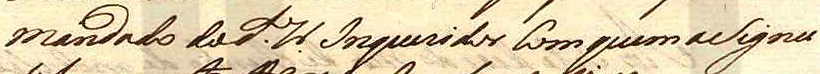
mandado do d̄.o Sr. Inquizidor Com quem asignei
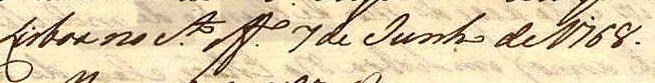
Lisboa no S.to off.o 7 de Iunho de i768.
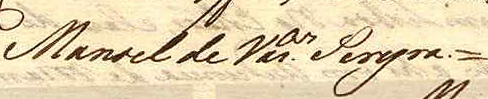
Manoel de Vas.os Perejra =
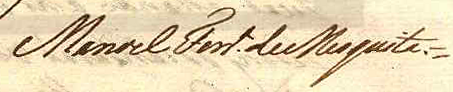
Manoel Ferr.a de Mesquita.=
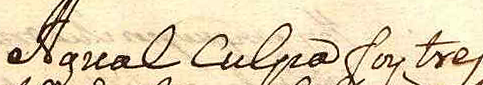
A qual Culpa foy tres
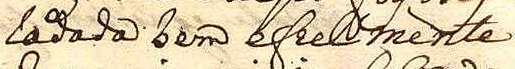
ladada bem e fielmente
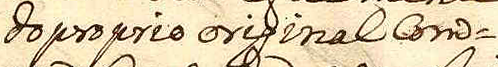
do proprio original com
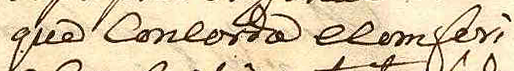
que concorda e comferi
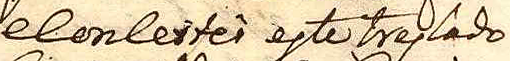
e concertei este treslado
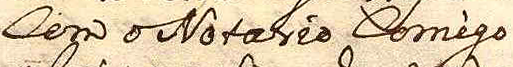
Com o Notario Comigo
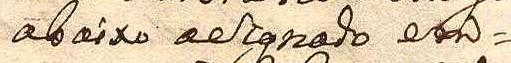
abaixo asignado em
